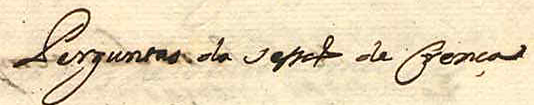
Perguntas da sessaõ de Crença
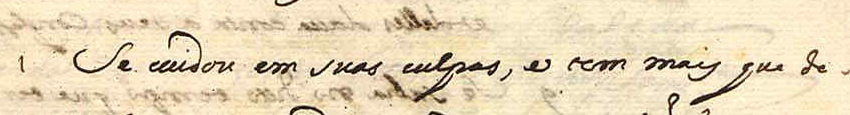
1 Se cuidou em suas culpas, e tem mais que de
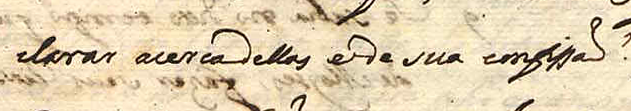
clarar acerca dellas e de sua confissaõ?
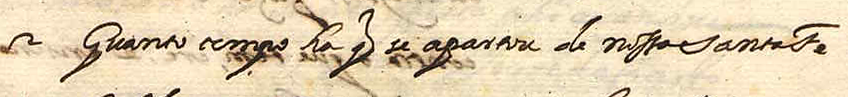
2 Quanto tempo ha q̄ se apartou de nossa Santa Fe
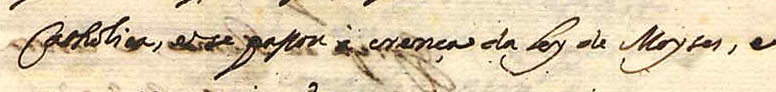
Catholica, e se passou à crença da ley de Moyses, e
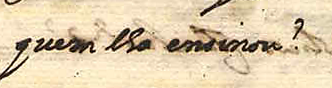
quem lho ensinou?
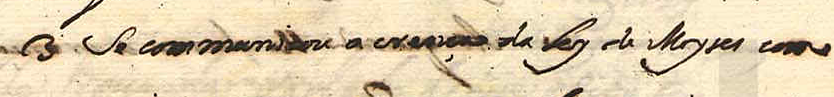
3 se communicou a crença da ley de Moyses com
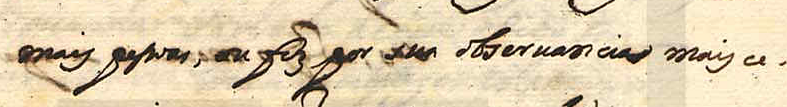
mais pessoas, ou fez por sua obseruancia mais ce
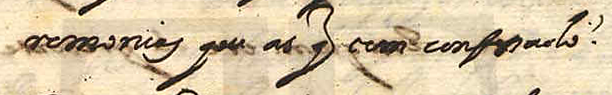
remonias que as q̄ tem confessado?
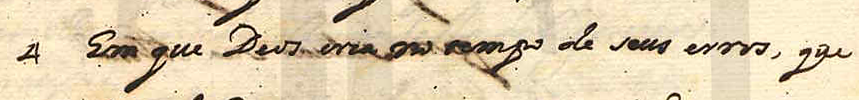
4 Em que Deos cria no tempo de seus erros, que
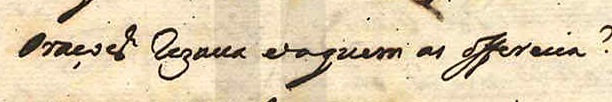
oraçoẽs Rezaua e a quem as offerecia?
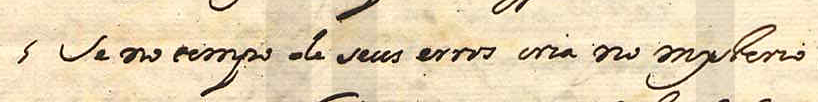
5 Se no tempo de seus erros cria no mysterio
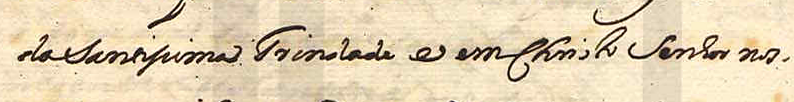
da Santissima Trindade e em Christo Senhor nos
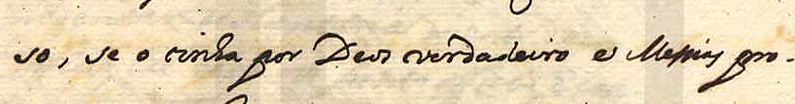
so, se o tinha por Deos verdadeiro, e Messias pro
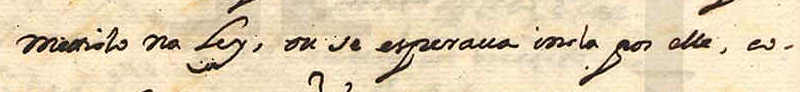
mettido na Ley, ou se esperaua inda por elle, co
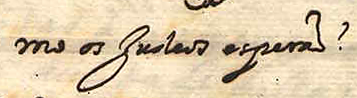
mo os Judeos esperaõ?
